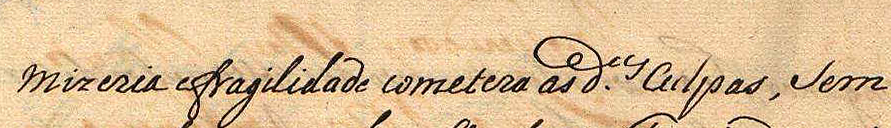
mizeria e fragilidade cometera as d.as culpas, sem
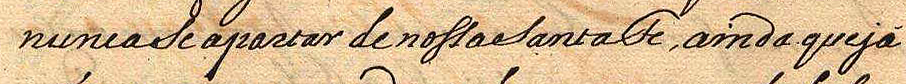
nunca se apartar de nossa Santa Fe, ainda que já
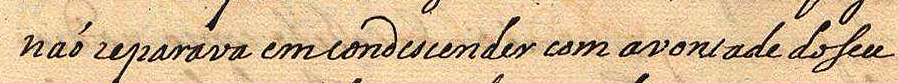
naõ reparava em condescender com a vontade do seu
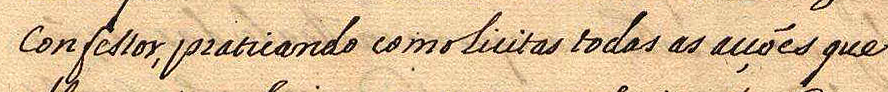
confessor, praticando como licitas todas as acçoẽs que
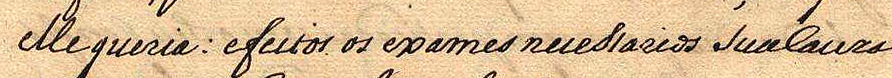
elle queria: e feitos os exames necessarios sua cauza
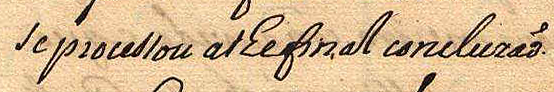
se processou athe final concluzaõ.
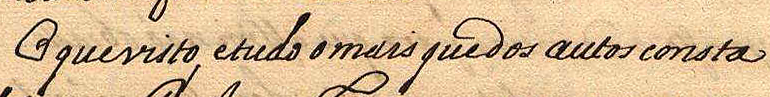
O que visto, e tudo o mais que dos autos consta
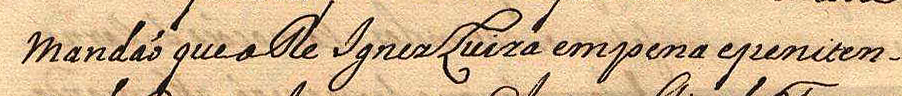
mandaõ, que a Re Ignez Luiza em pena e peniten
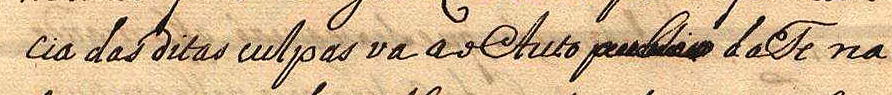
cia das ditas culpas va ao Auto publico da Fe na
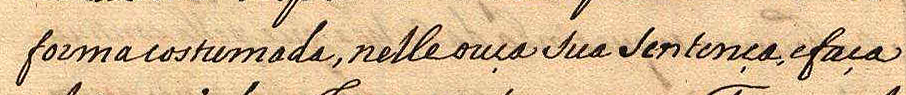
forma costumada, nelle ouça sua sentença, e faça
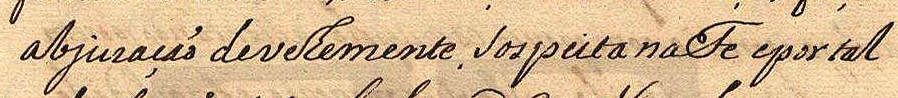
abjuraçaõ de vehemente, sospeita na Fe e por tal
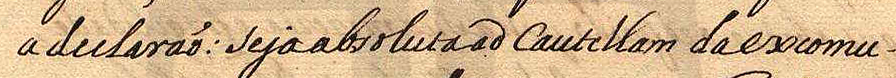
a declaraõ: seja absoluta ad Cautellam da excomu
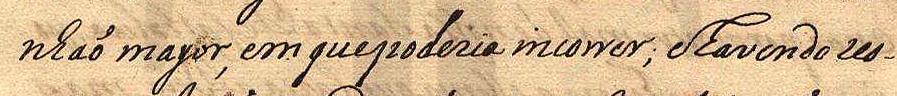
nhaõ mayor, em que poderia incorrer; e havendo res
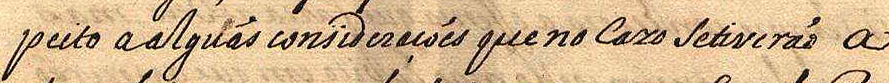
peito a alguās considezaçoẽs que no Cazo se tiveraõ a
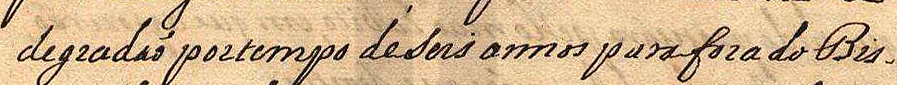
degradaõ por tempo de seis annos para fora do Bis
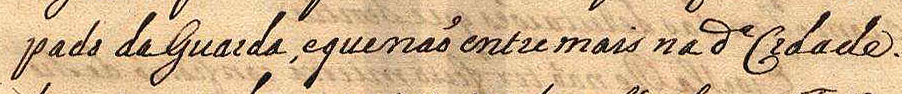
pado da Guarda, e que naõ entre mais na da Cidade.
